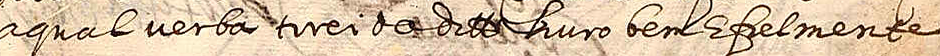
a qual uerba tirei do ditto liuro bem E fielmente
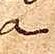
a
